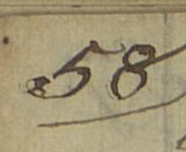58
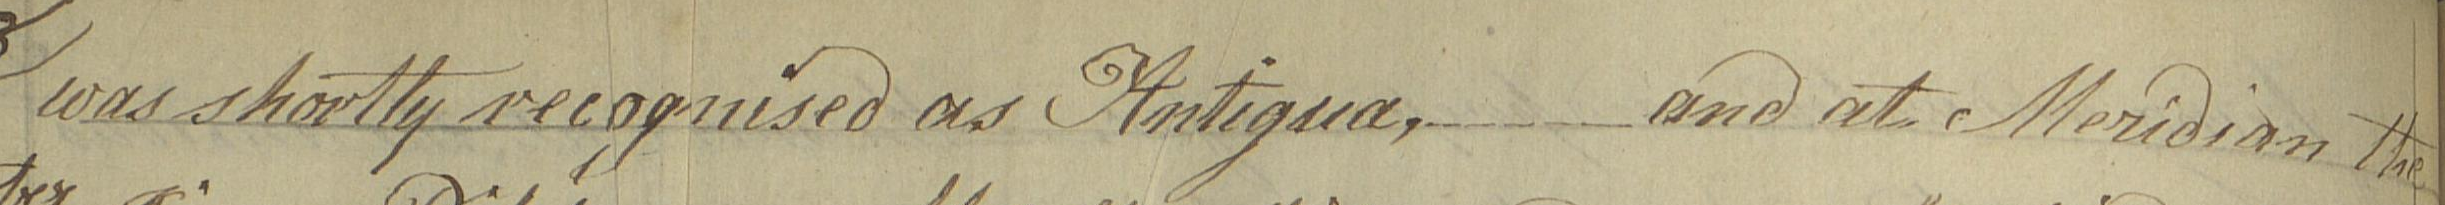was shortly recognised as Antigua, and at Meridian the
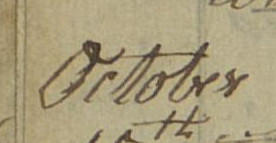October
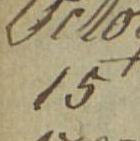15^th
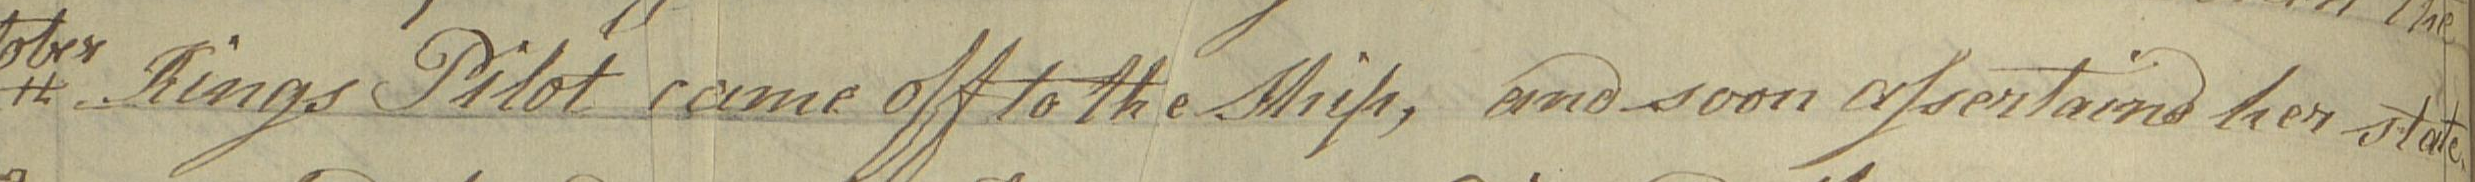Kings Pilot came off to the Ship, and soon assertaind her state
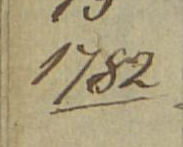1782
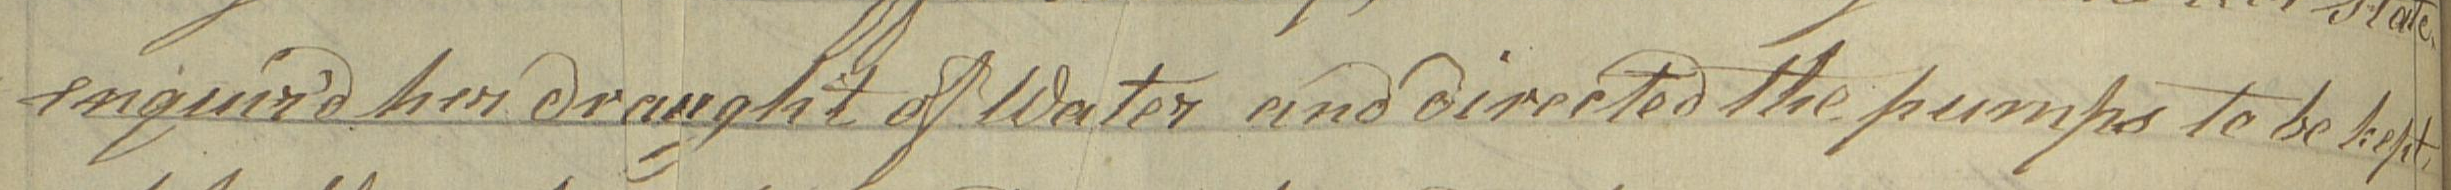inquir'd her draught of Water and directed the pumps to be kept
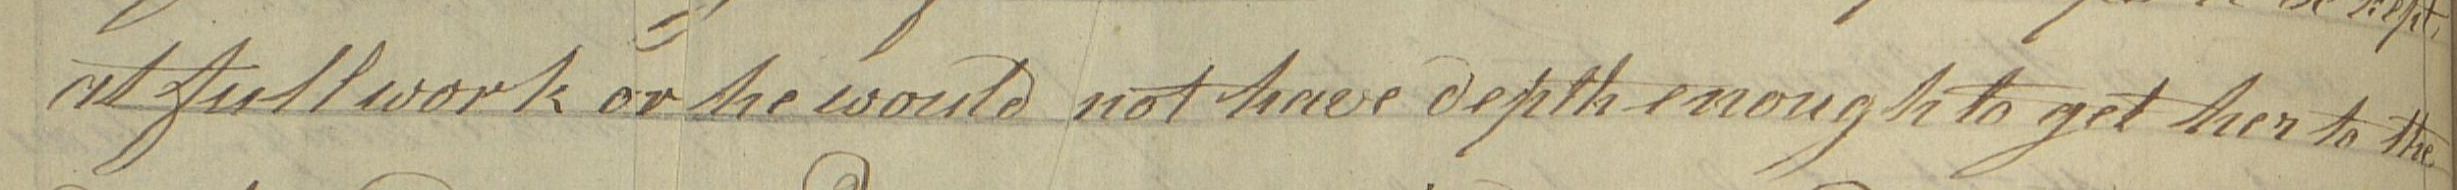at full work or he would not have depth enough to get her to the
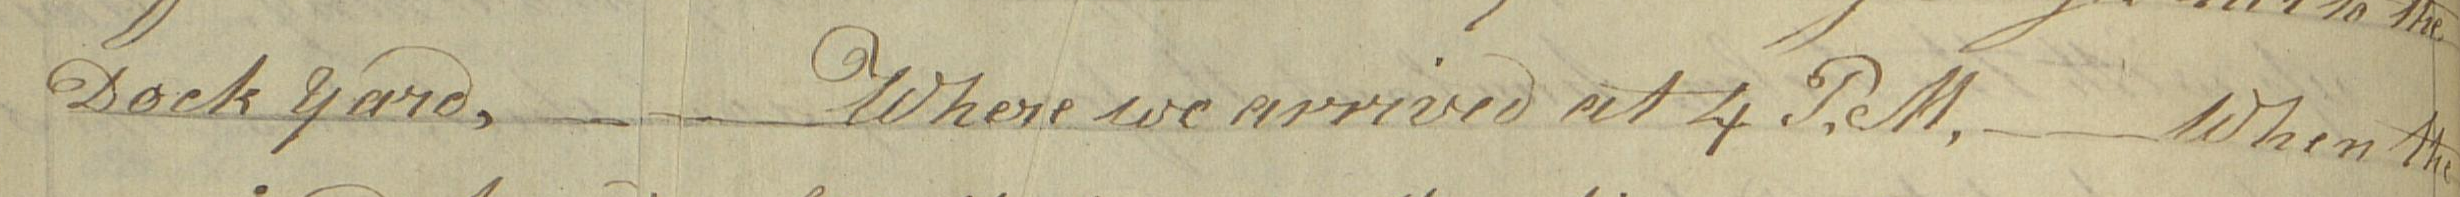Dock Yard, Where we arrived at 4 P.M. When the
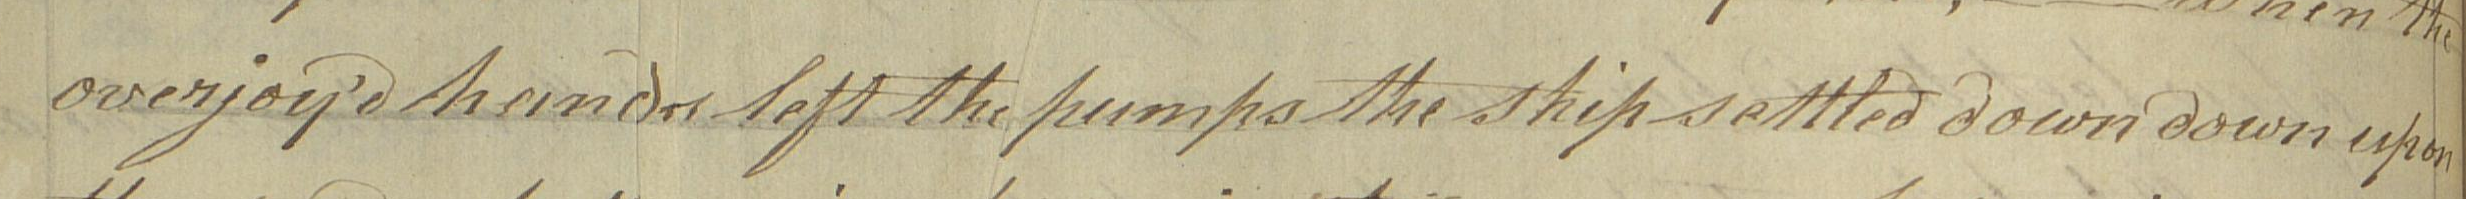overjoy'd hands left the pumps the ship settled down down upon
